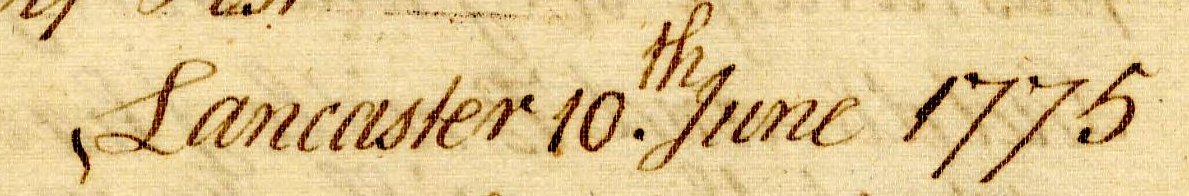Lancaster 10^th. June 1775
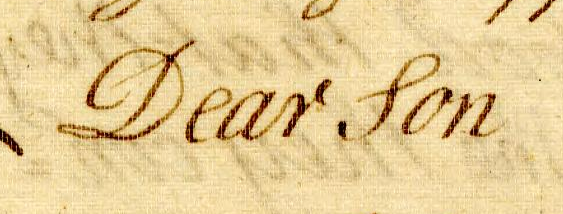Dear Son
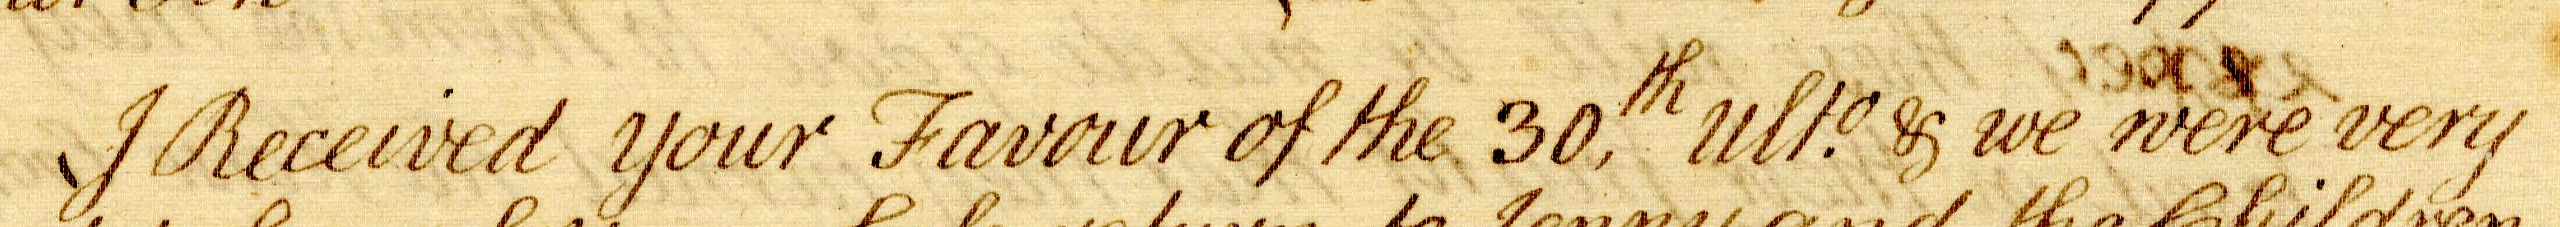I Received your Favour of the 30^th. ult^o. &, we were very
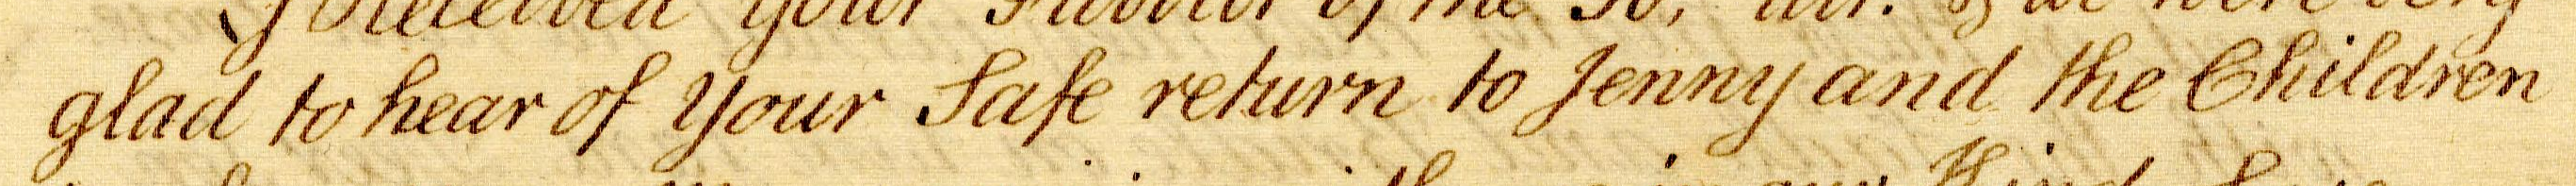glad to hear of Your Safe return to Jenny and the Children
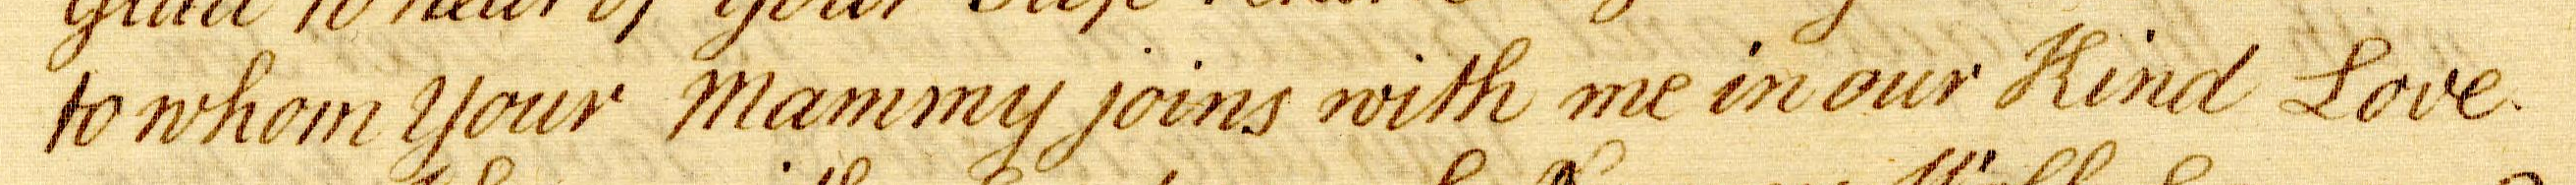to whom Your Mammy joins with me in our Kind Love.
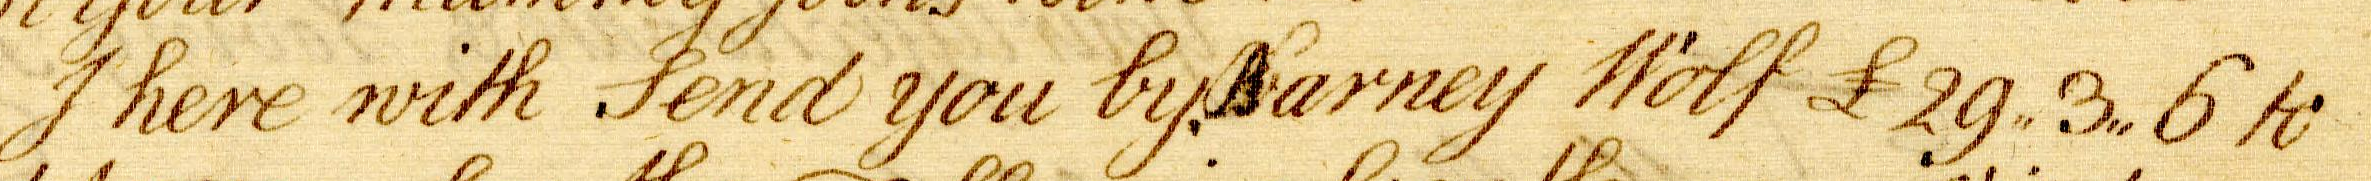I here with send You by Barney Wolf £29..3..6 to
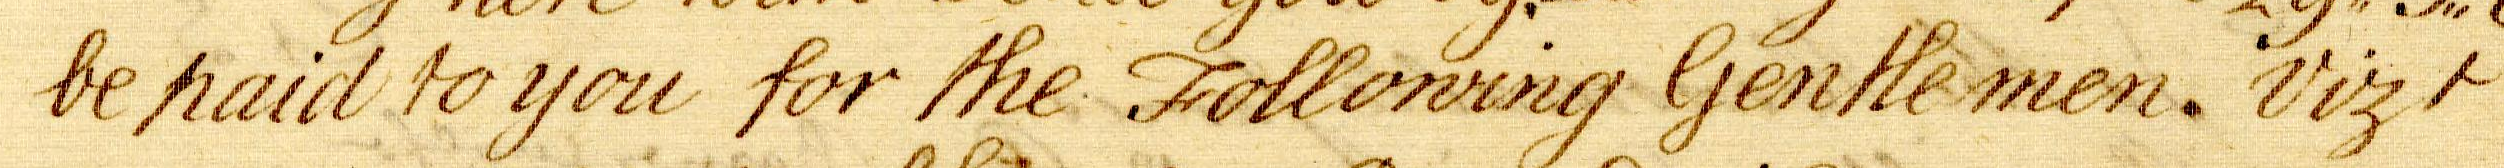be paid to you for the Following Gentlemen. Vizt
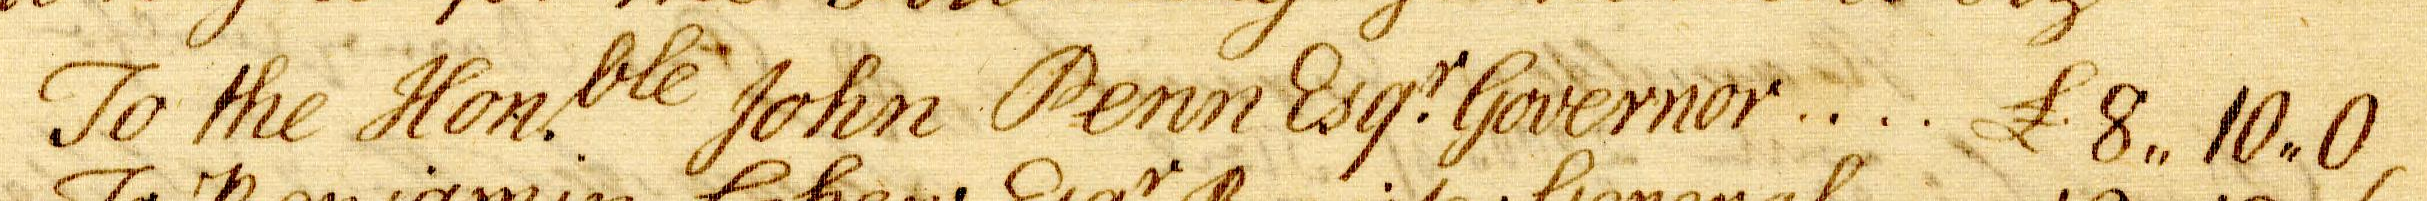To the Hon^ble. John Penn Esq^r. Governor.... £8..10..0
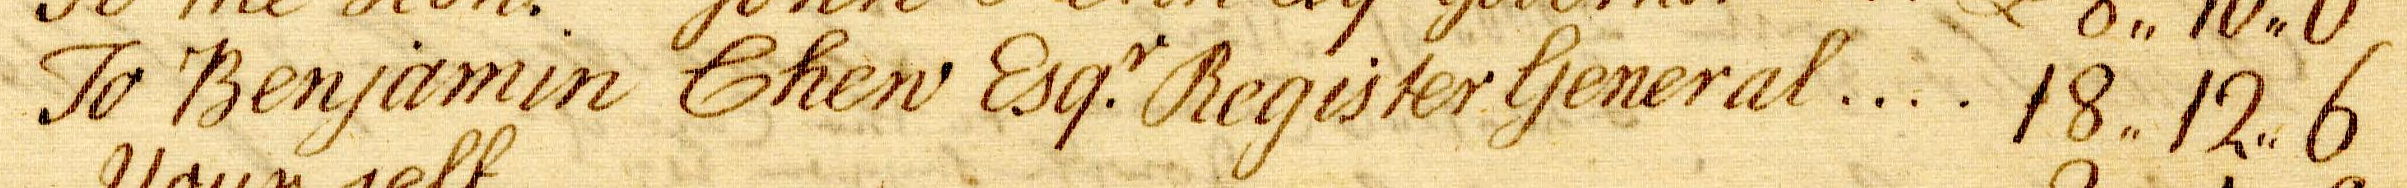T0 Benjamin Chew Esq^r. Register General....18..12..6
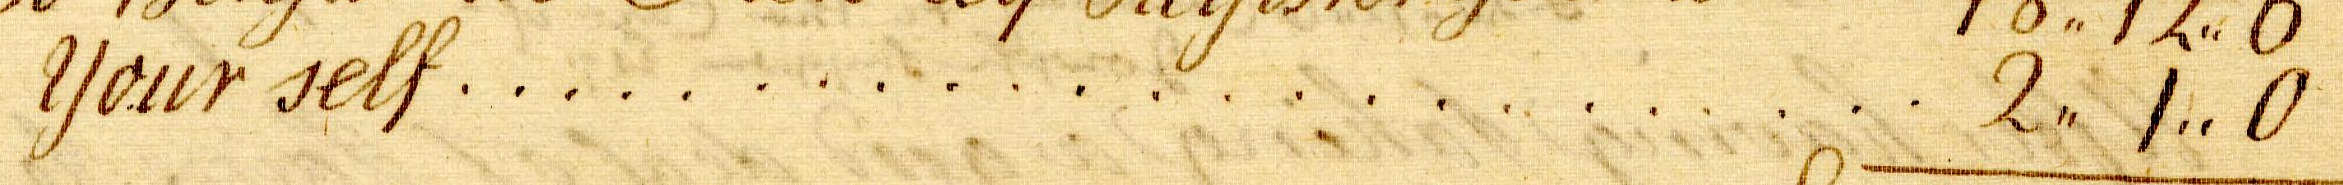Your self.......................2..1..0
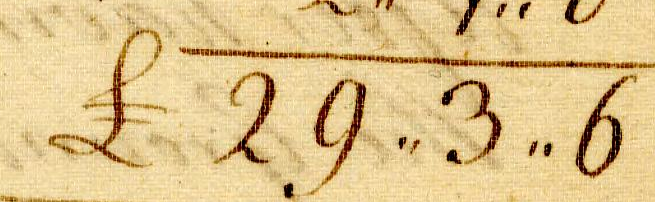₤29..3..6
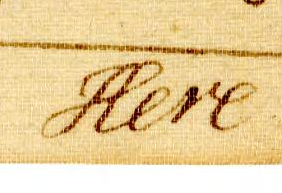Here
